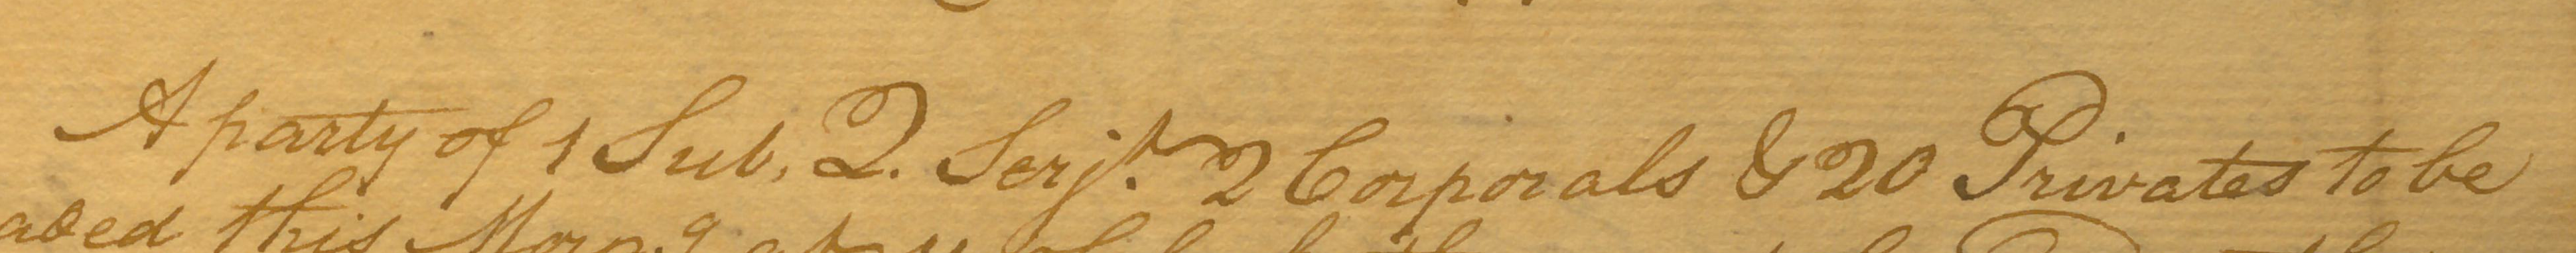A party of 1 Sub. 2. Serj^ts. 2 Corporals & 20 Privates to be
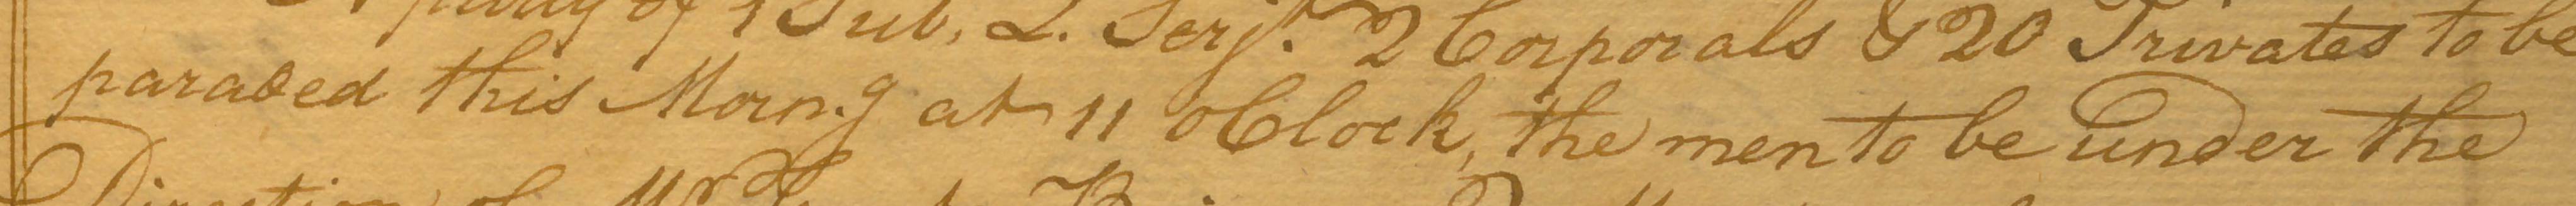paraded this Morn^g. at 11 oClock, the men to be under the
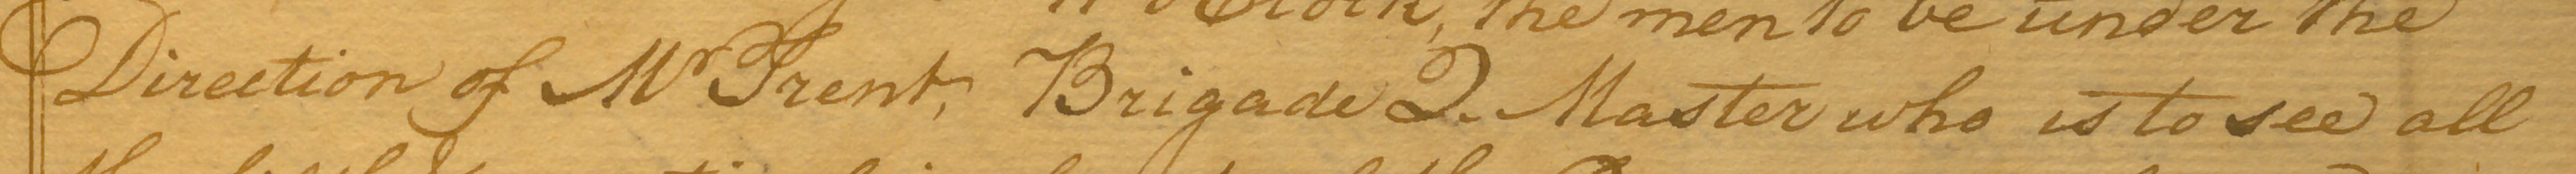Direction of M^r. Trent, Brigade Q. Master who is to see all
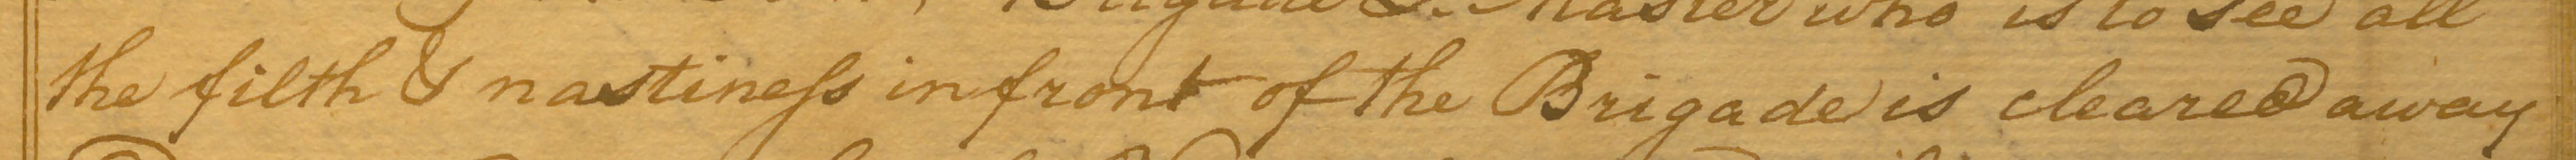the fifth & nastiness in front of the Brigade is cleared away
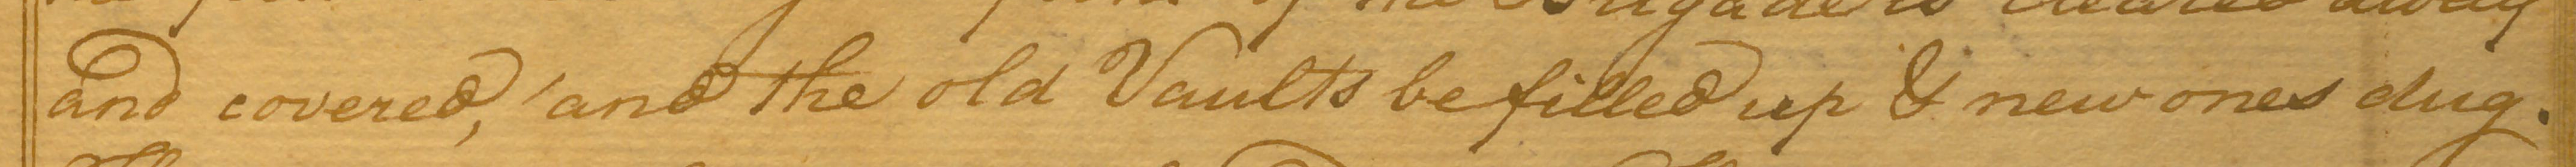and covered, and the old Vaults be filled up & new ones dug.
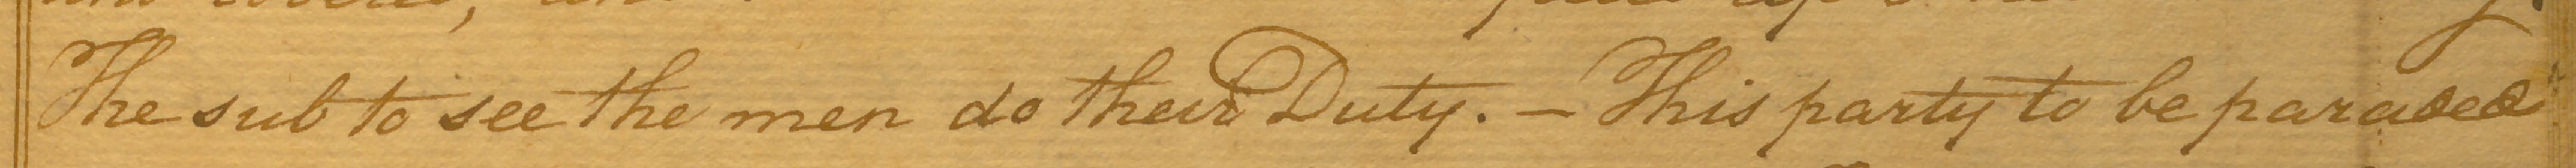The sub to see the men do their Duty.- This party to be paraded
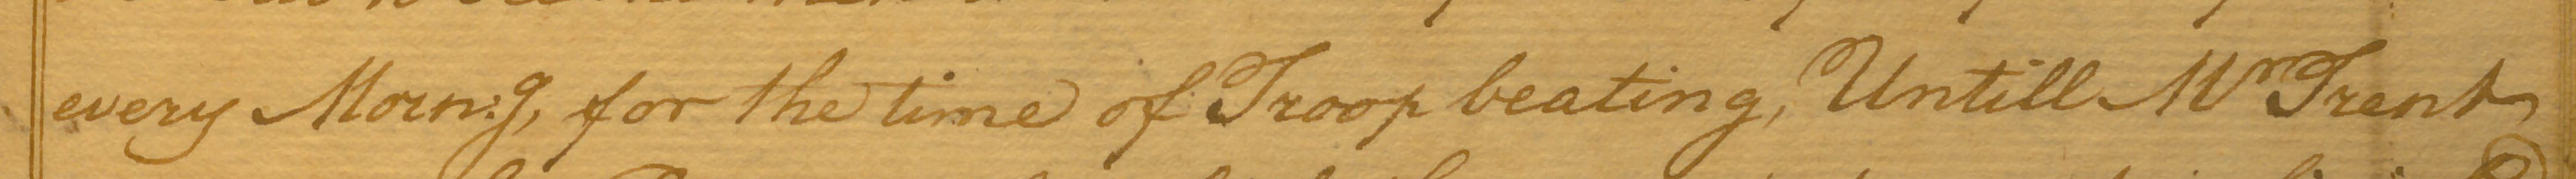every Morn^g., for the time of Troop beatin, Untill M^r. Trent
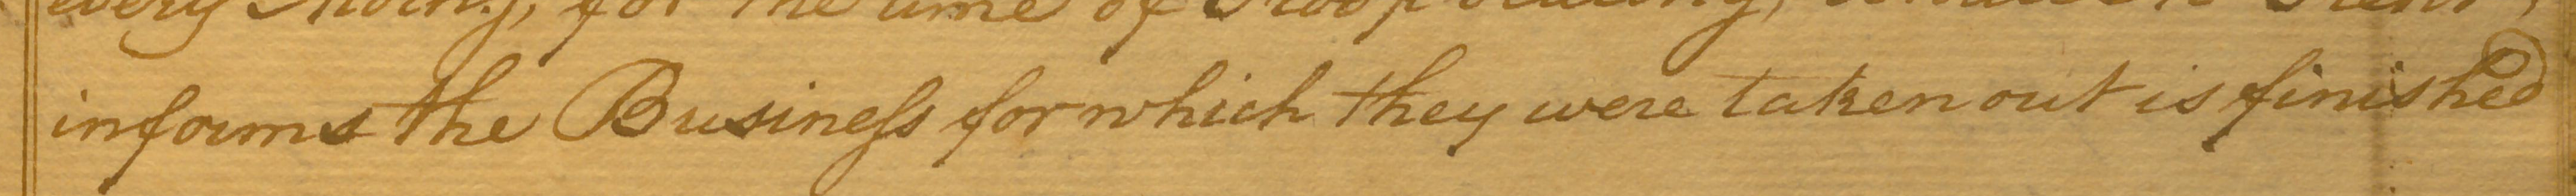informs the Business for which they were taken out is finished
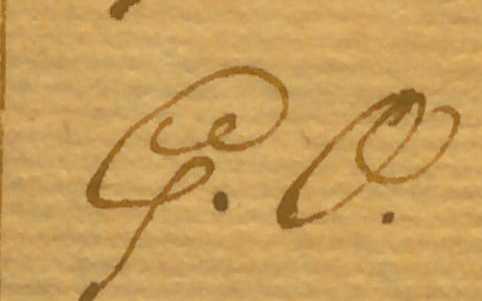G. O.
